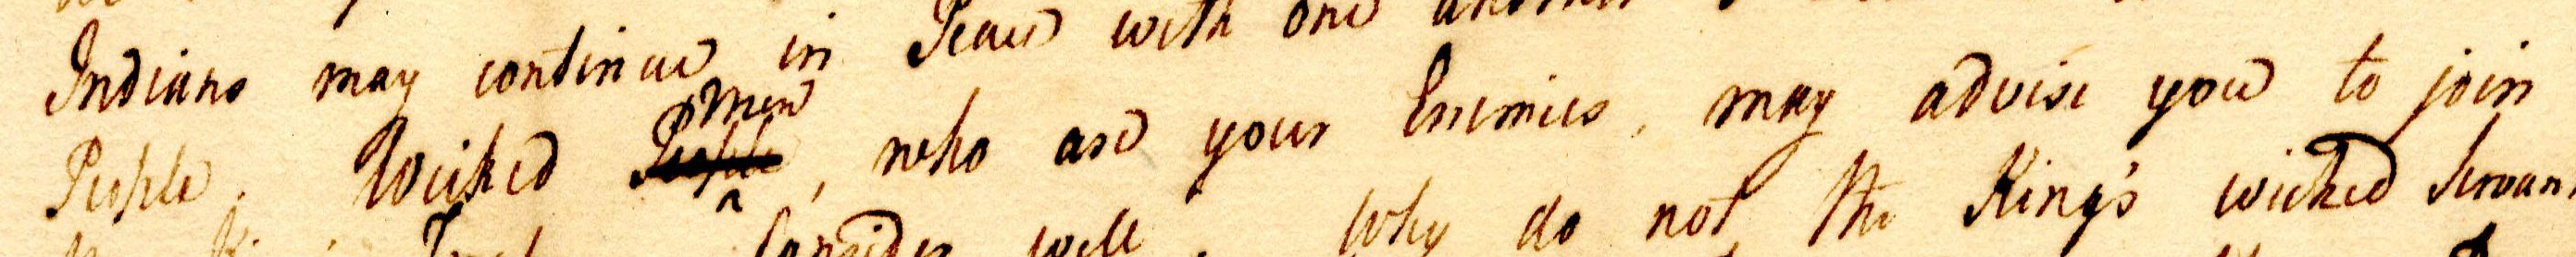People. Wicked People ^ who are your Enemies my advise you to join
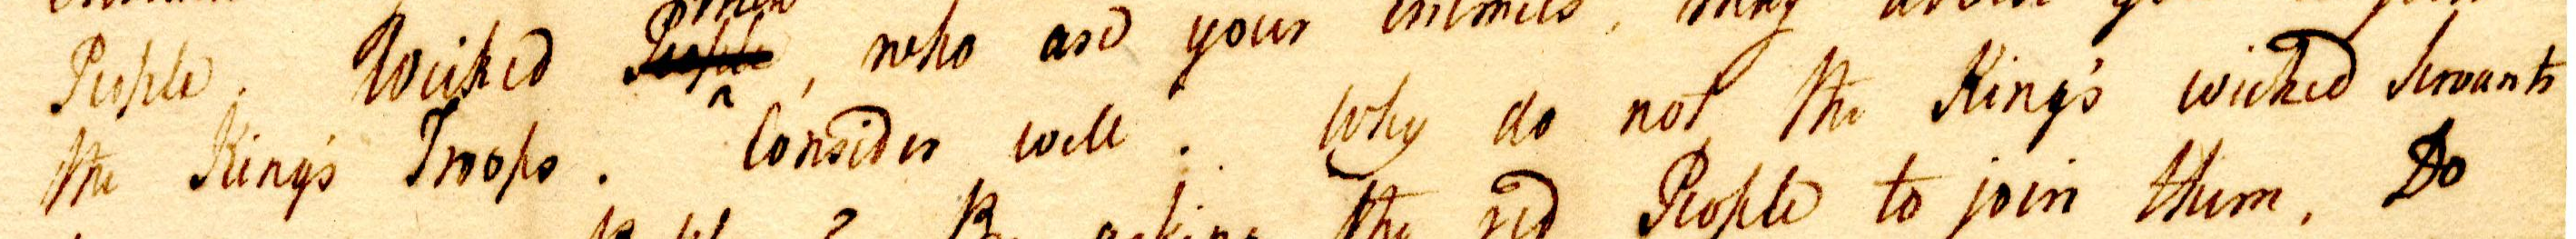the King's Troops. Consider well. Why do not the King's wicked Servants
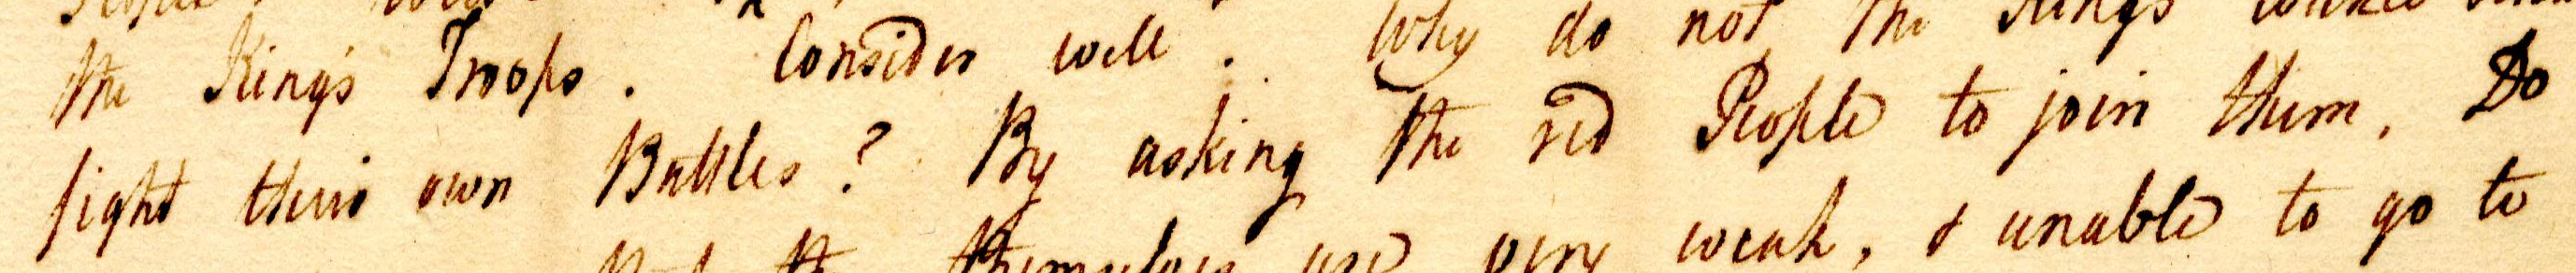fight their own Battles? By asking the red People to join them, Do
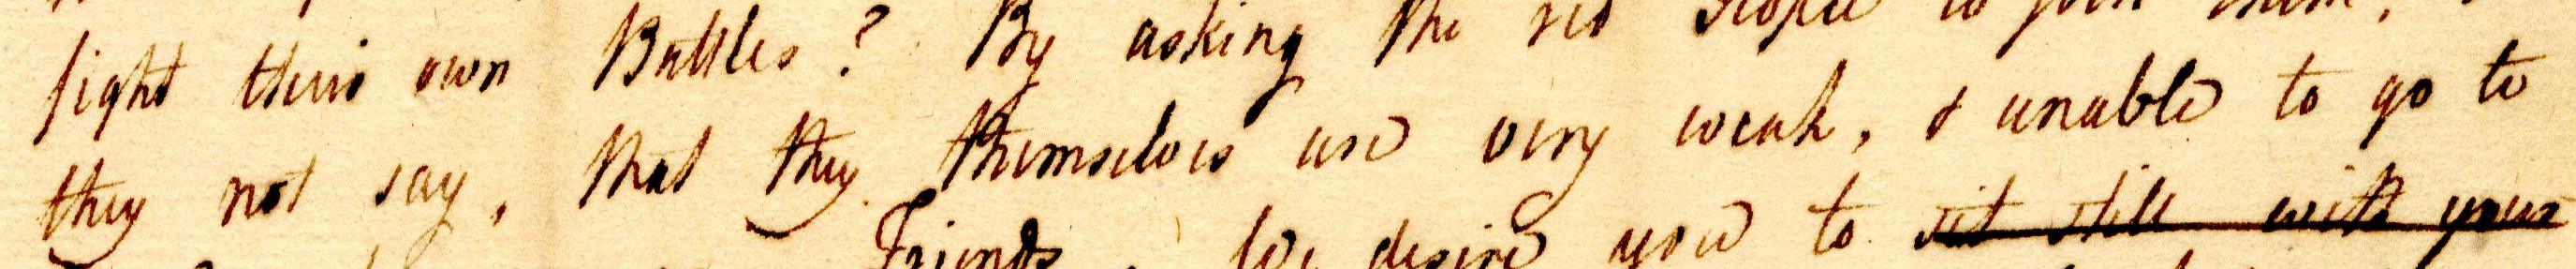they not say, that they themselves are very weak, & unable to go to
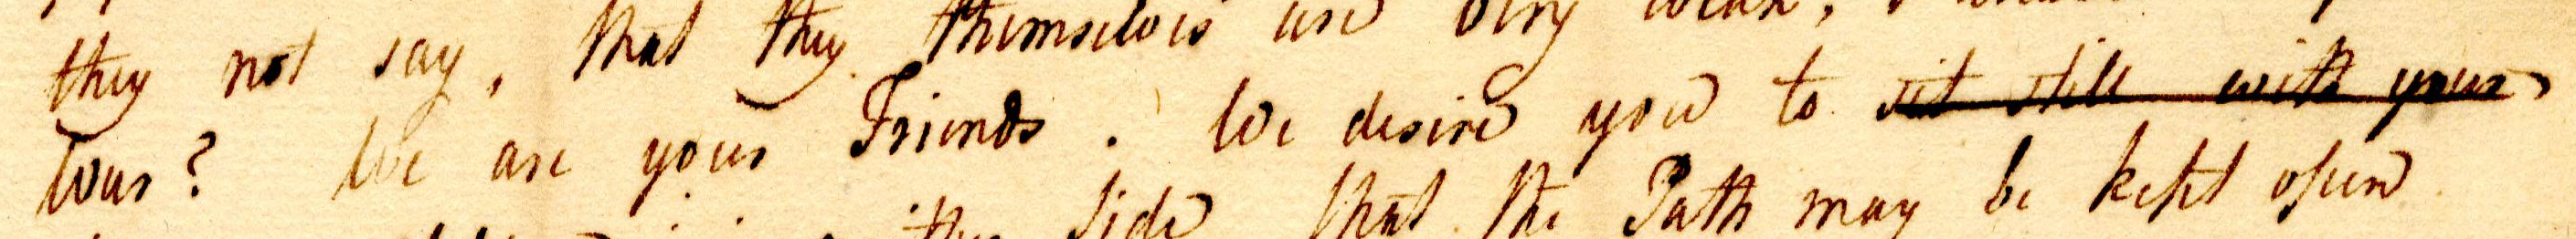war? We are your Friends. We desire you to sit still with your
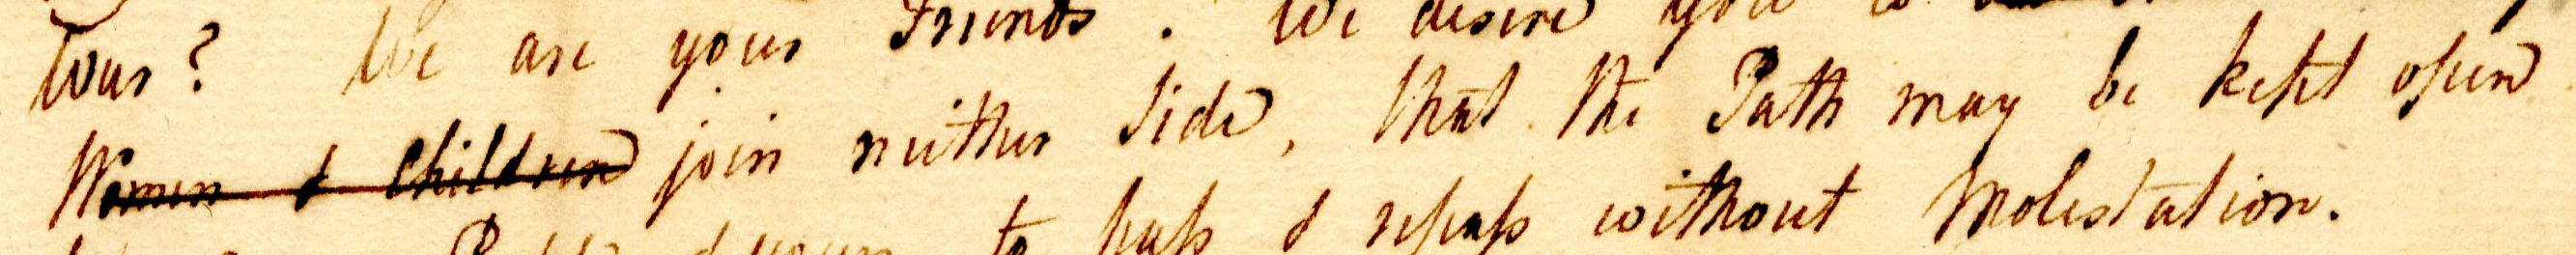Women & Children join neither side, that the Path may be kept open
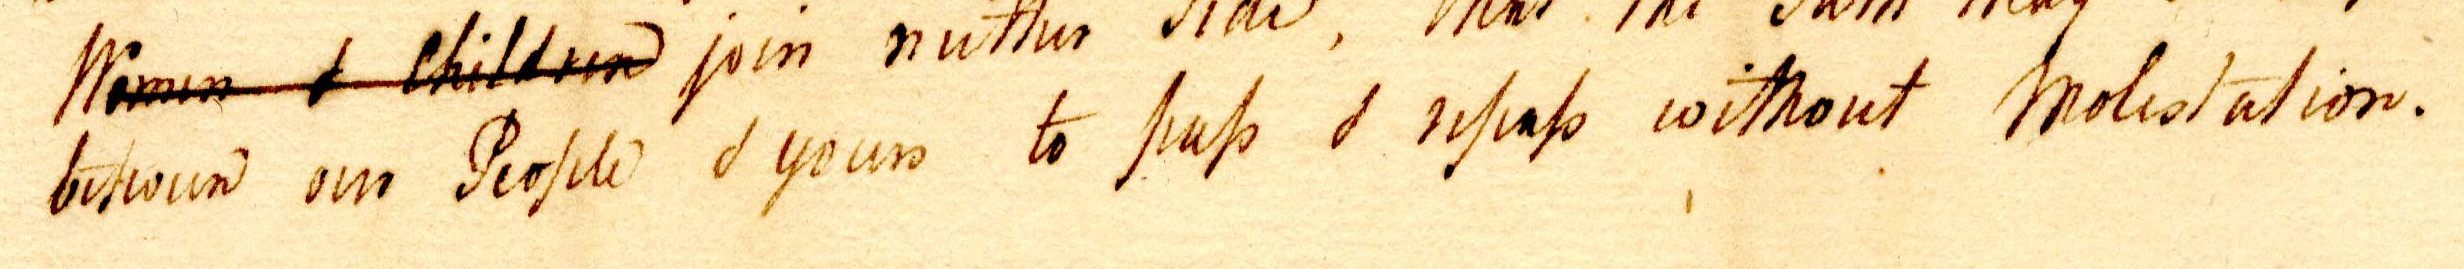between our People & yours to pass & repass without Molestation.
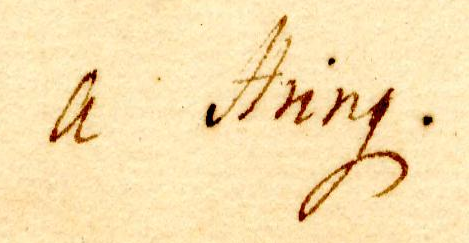a String.
